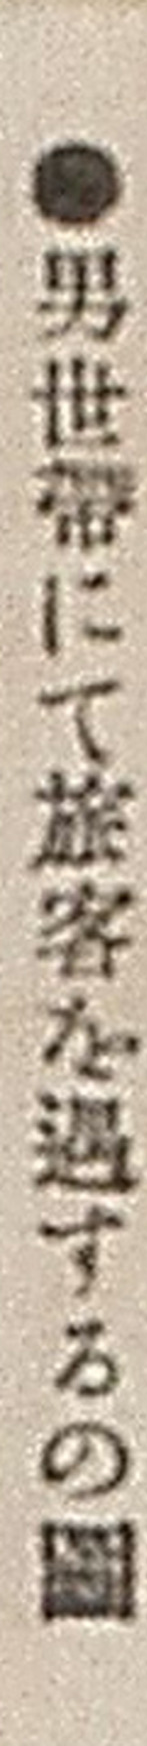●男世帯にて旅客を遇するの図
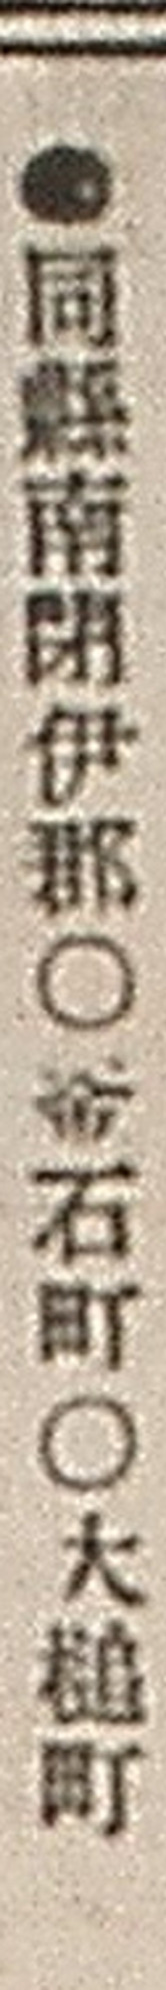●同県南閉伊郡〇釜石町〇大槌町
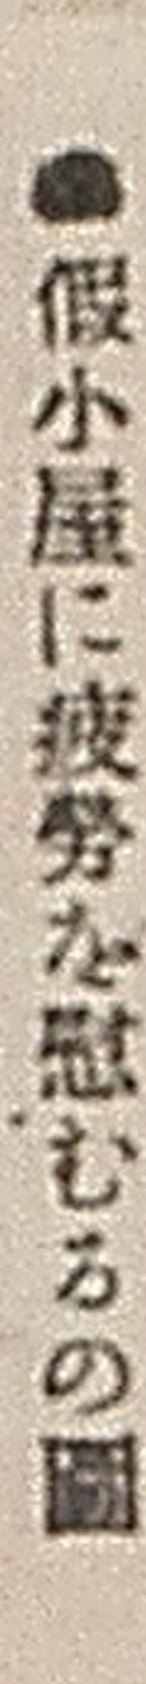●仮小屋に疲労を慰むるの図
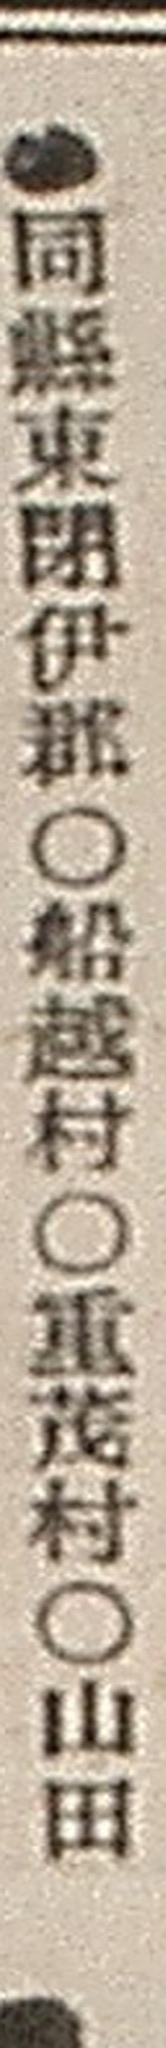●同県東閉伊郡〇船越村〇重茂村〇山田
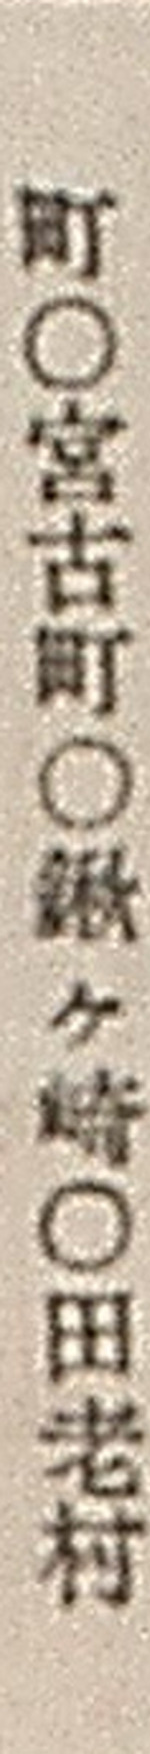街〇宮古町〇鍬ケ崎〇田老村
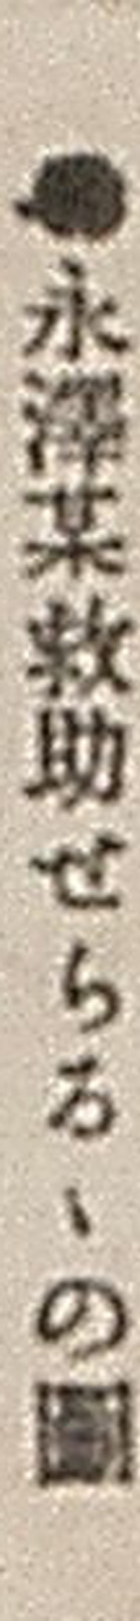●永沢某救助せらるゝの図
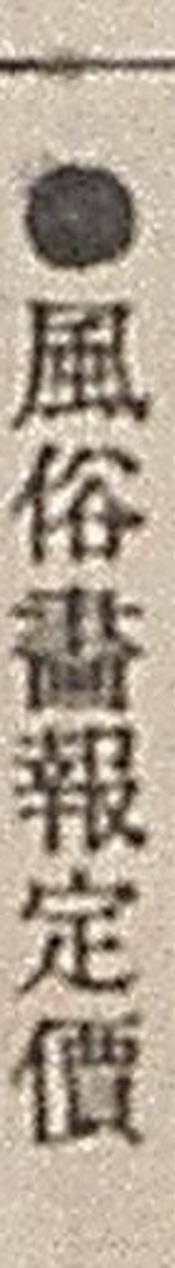●風俗画報定価
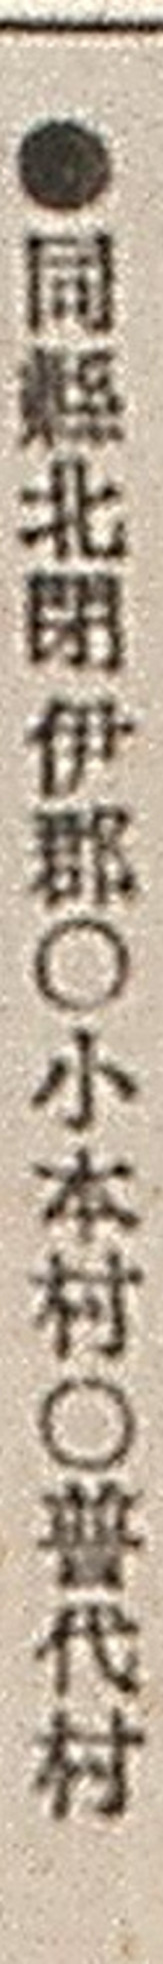●同県北閉伊郡〇小本村〇普代村
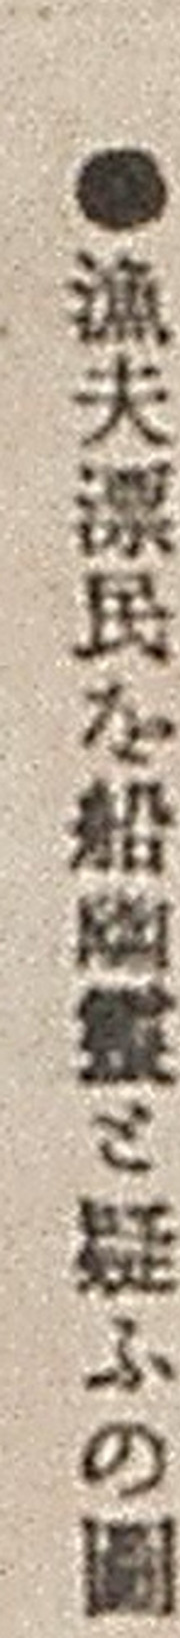●漁夫漂民を船幽霊と疑ふの図
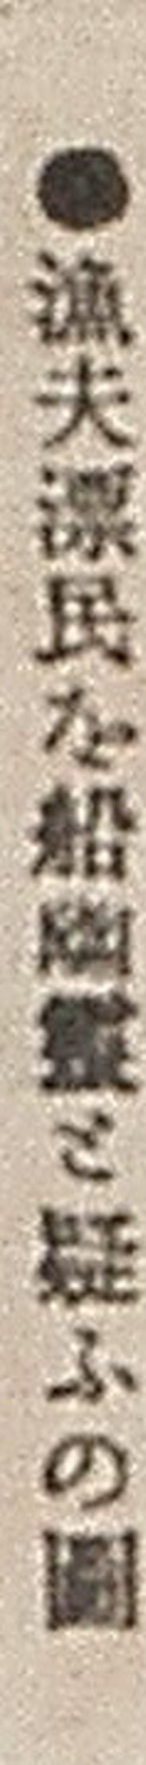●漁夫漂民を船幽霊と疑ふの図
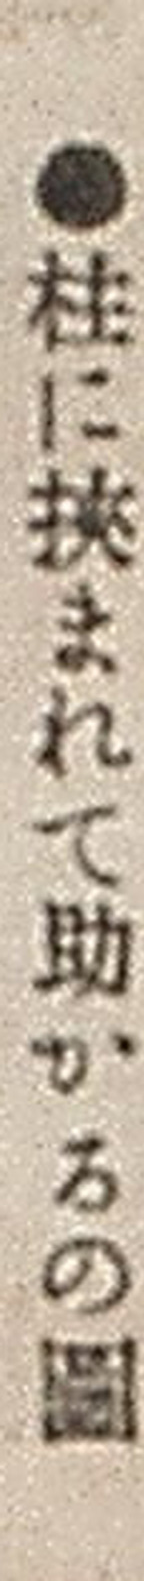●柱に挟まれて助かるの図
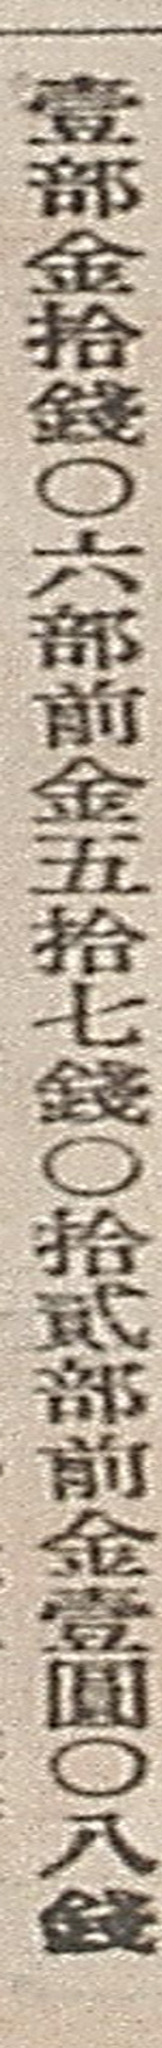壹部金拾銭◯六部前金五拾七銭◯拾二部前金壹円◯八銭
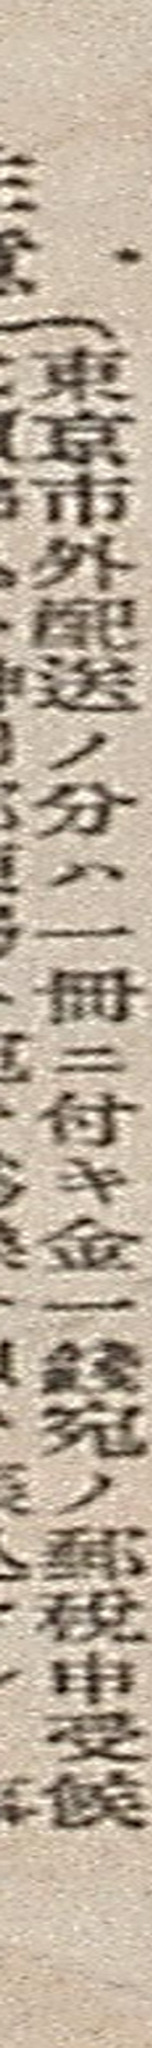注意東京市外配送ノ分ハ一冊ニ付キ金一銭宛ノ郵税申受候
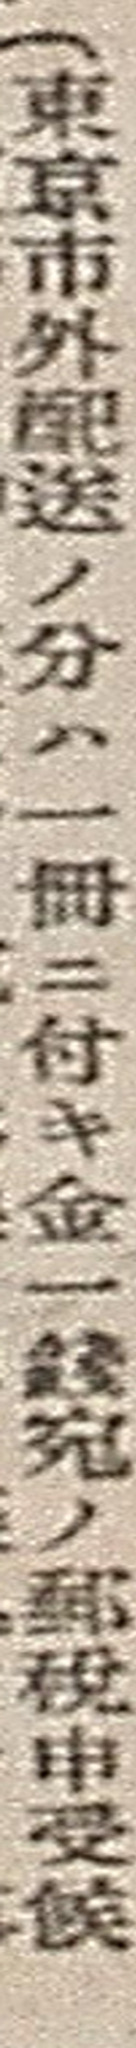注意東京市外配送ノ分ハ一冊ニ付キ金一銭宛ノ郵税申受候
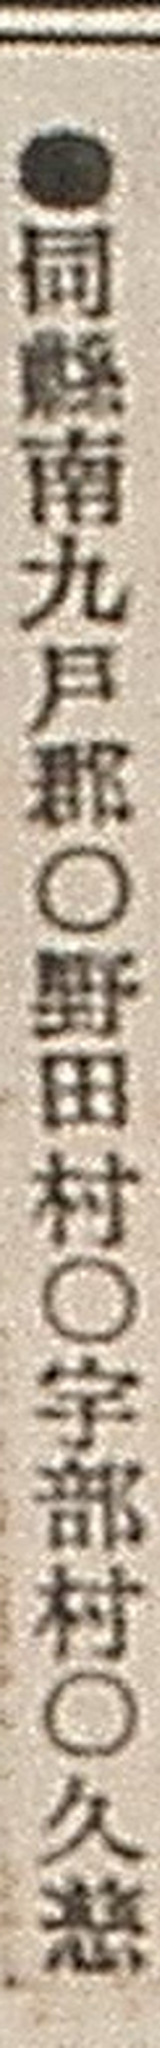●同県南九戸郡〇野田村〇宇部村〇久慈
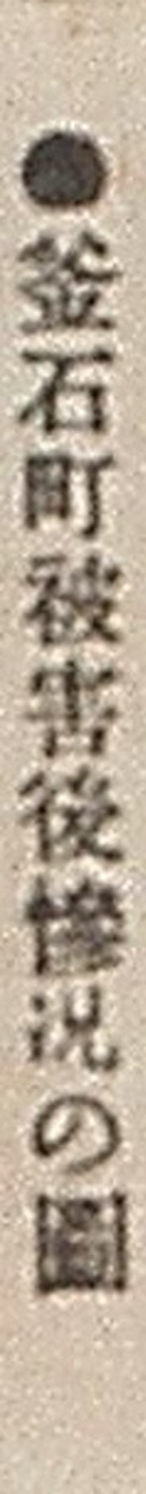●釜石町被害後惨況の図
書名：風俗畫報臨時増刊第百二十號　大海嘯被害録（下）
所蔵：東京大学地震研究所図書室 Earthquake Research Institute Library, The University of Tokyo, JAPAN
